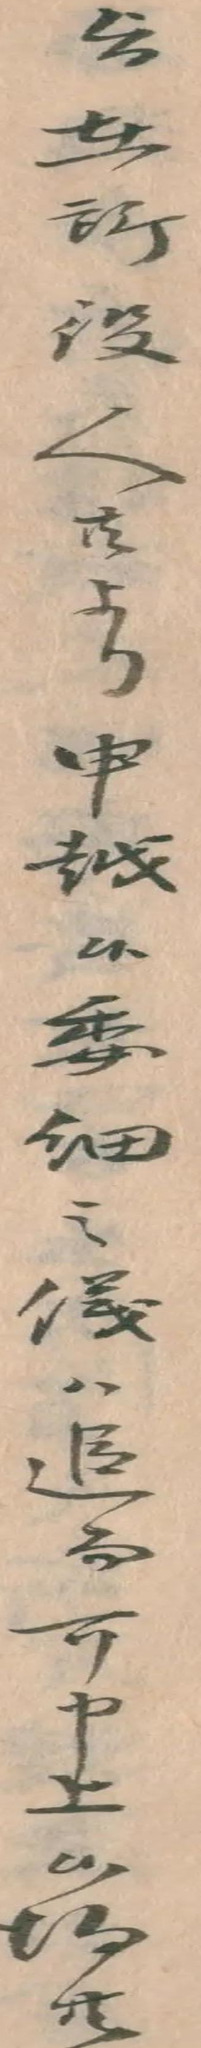と在所役人共ゟ申越候委細之儀ハ追而可申上候得共
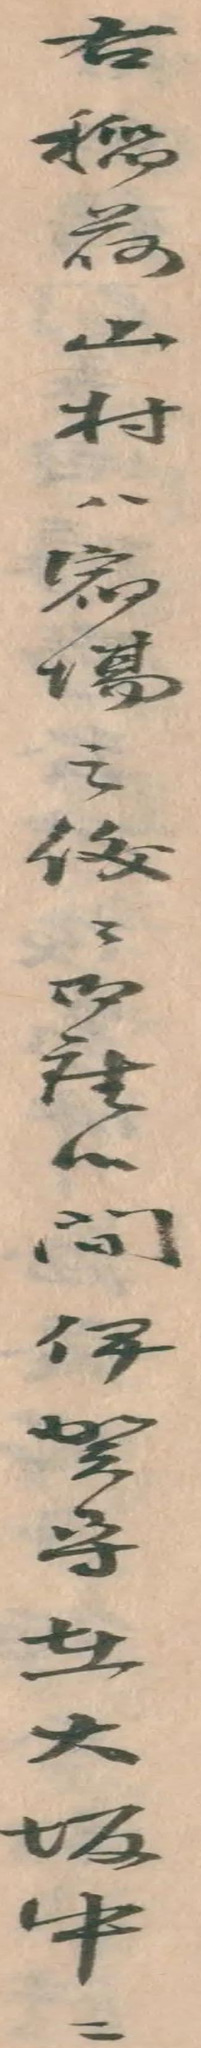右稲荷山村は宿場之儀ニ御座候間伊賀守大坂中二
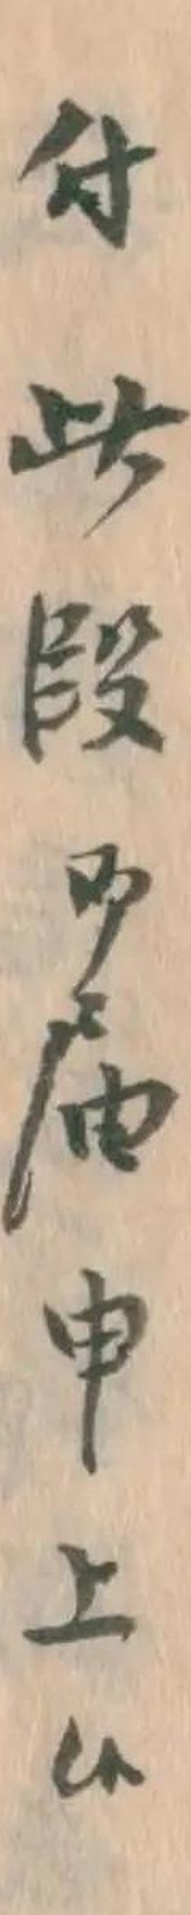付此段御届申上候
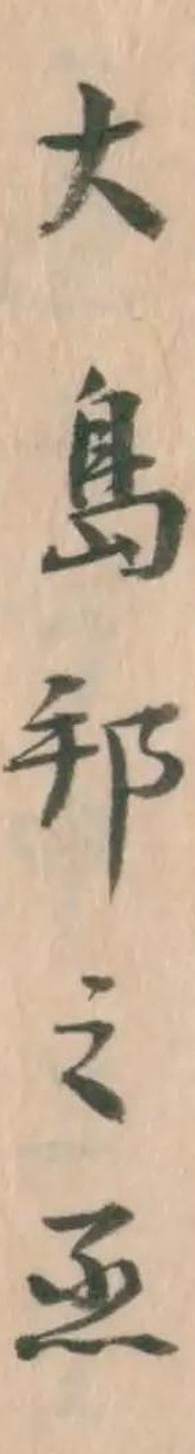大島邦之丞

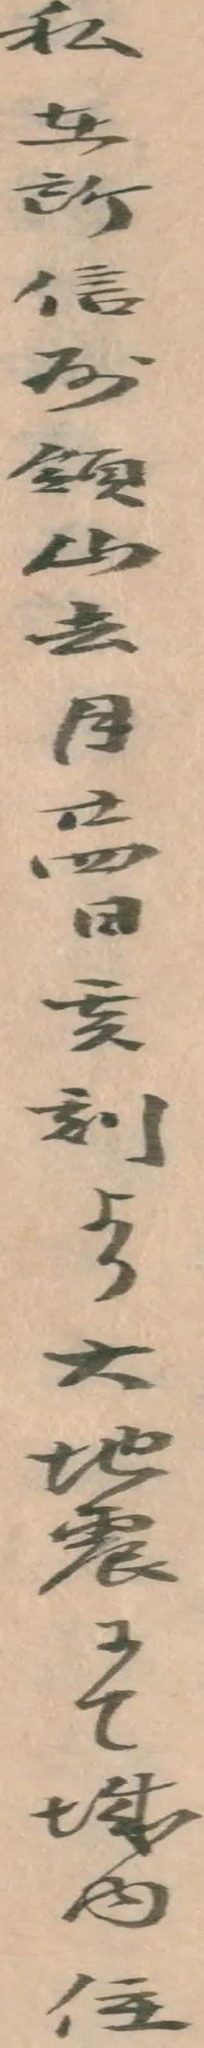私在所信州飯山去月廿四日亥刻より大地震にて城内住
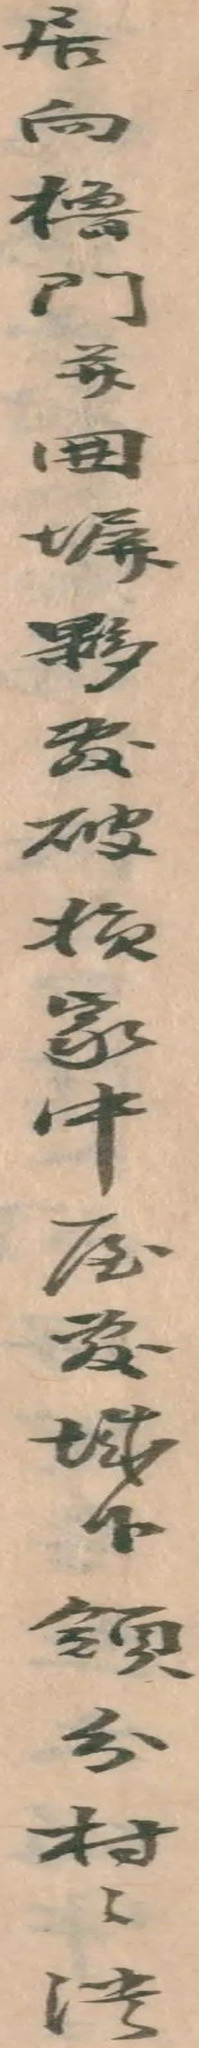居向櫓門并囲塀夥敷破損家中屋敷城下領分村々潰
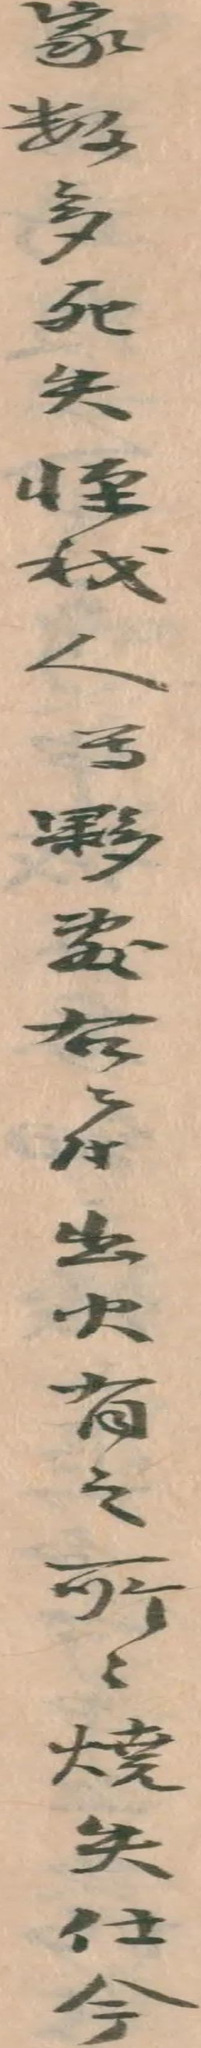家数多死失怪我人等夥敷右ニ付出火有之所々焼失仕今
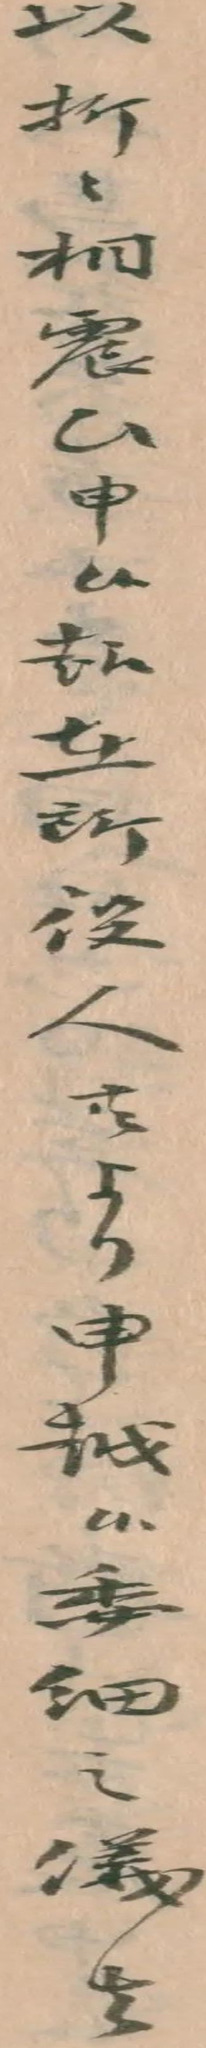以折々相震ひ申候趣在所役人共ゟ申越候委細之儀者
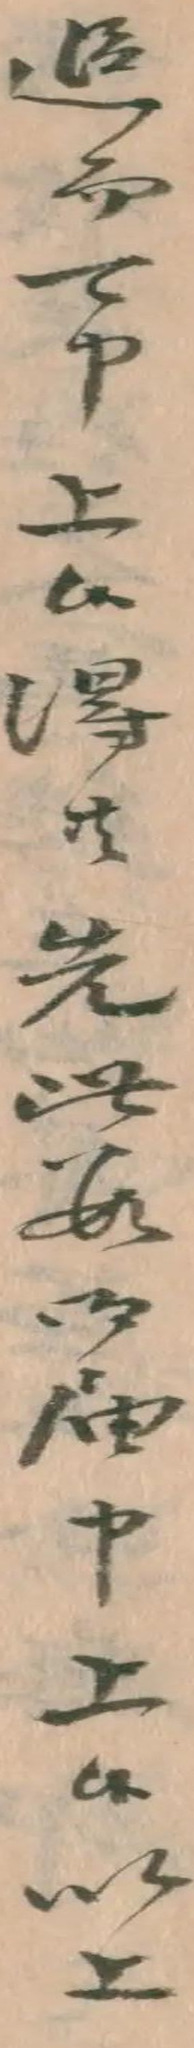追而可申上候得共先此段御届申上候已上
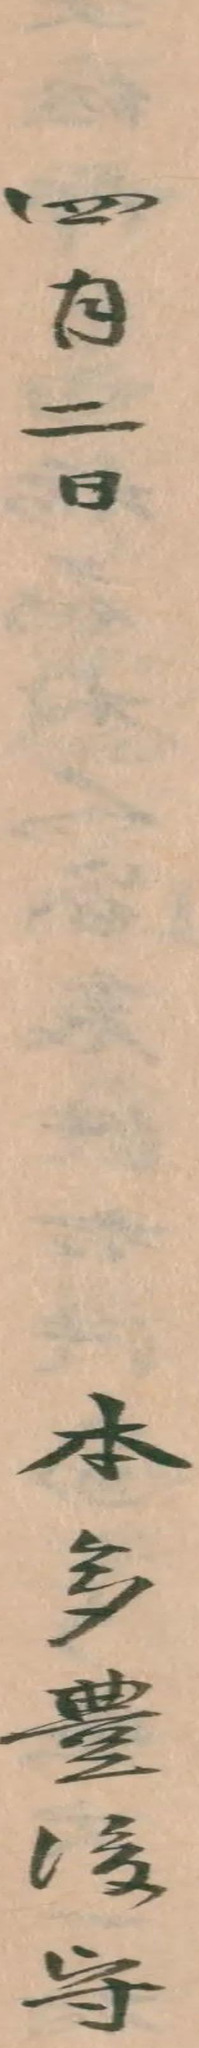四月二日本田豊後守
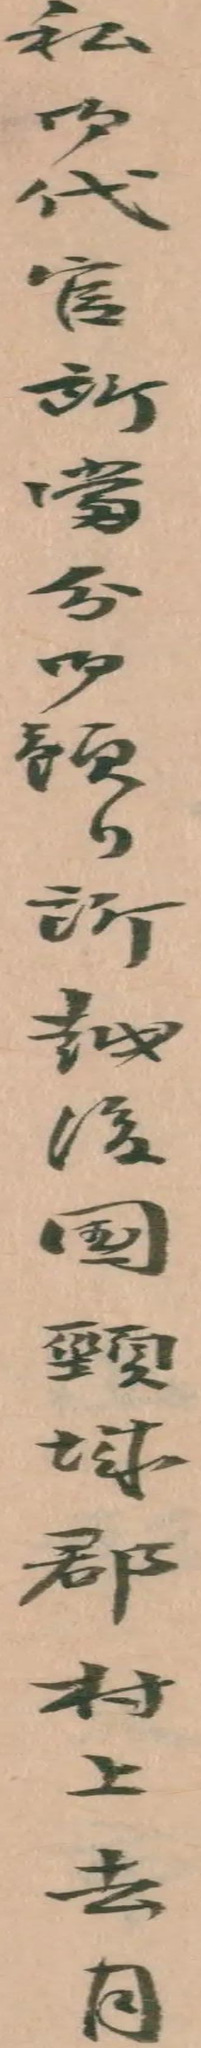私御代官所当分御預り所越後国頸城郡村上去月
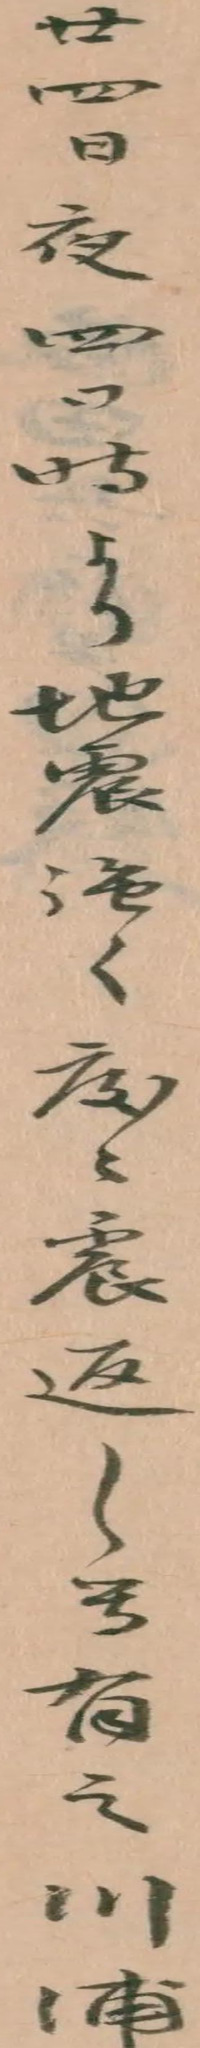廿四日夜四ッ時より地震強く度々震返し等有之川浦
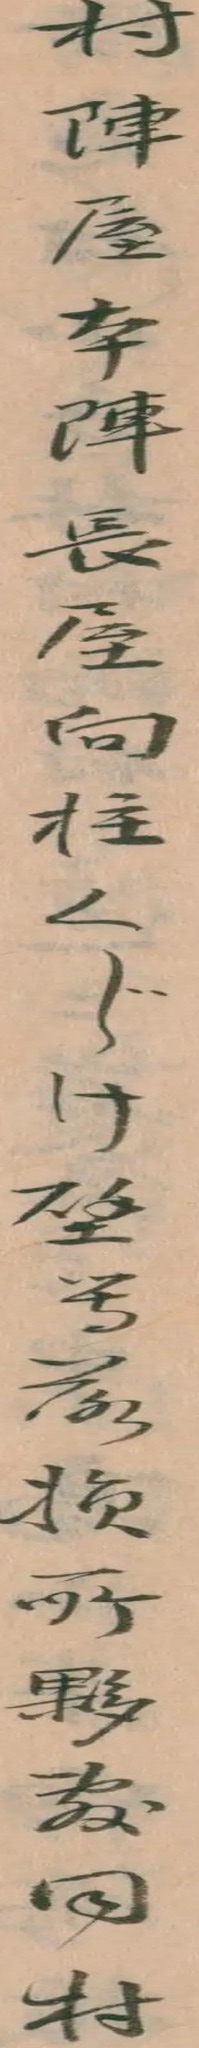村陣屋本陣長屋向柱くじけ壁等落損所夥敷同村
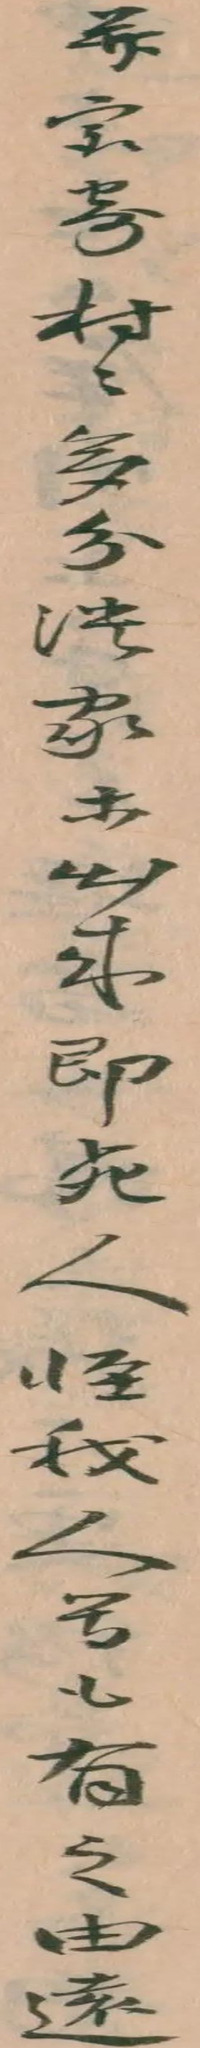并最寄村々多分潰家等出来即死人怪我人等も有之由遠
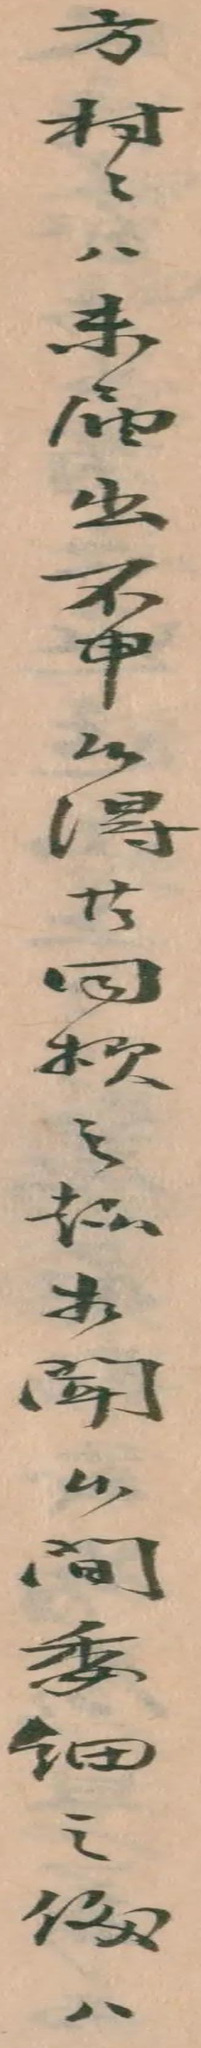方村々ハ未届出不申候得共同様之趣相聞候間委細之儀ハ
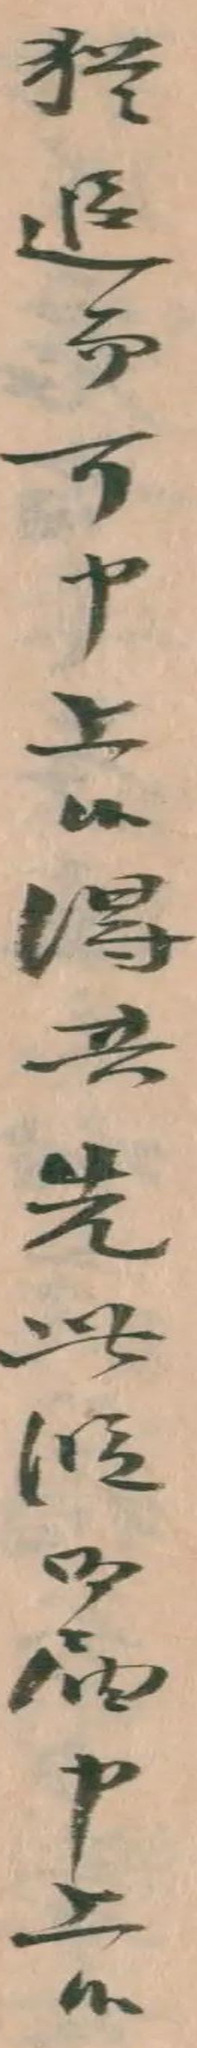猶追而可申上候得共先此段御届申上候
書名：地災撮要. 巻3(地震之部)-巻4(噴火之部)
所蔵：国立国会図書館 National Diet Library, JAPAN
